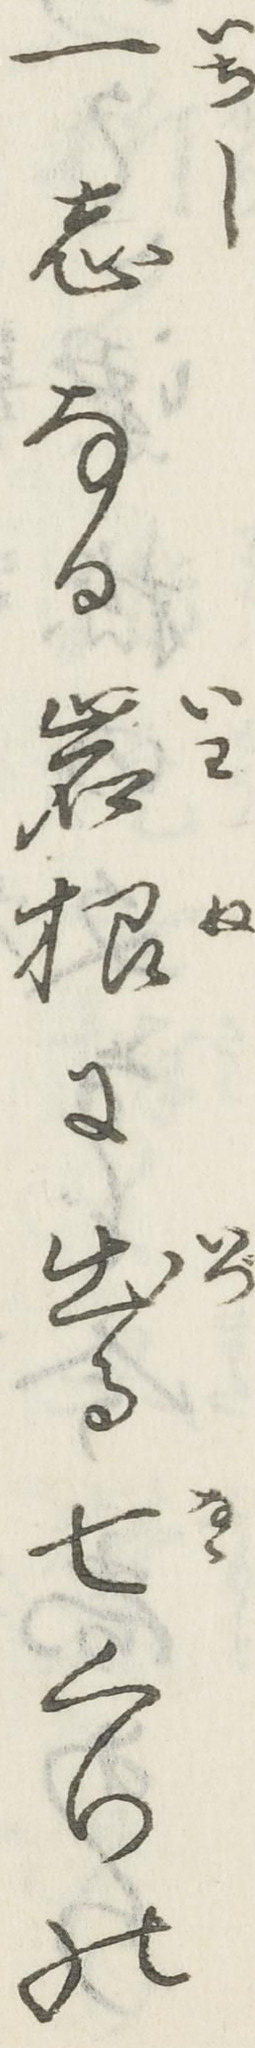一志なる岩根に出る七くりの
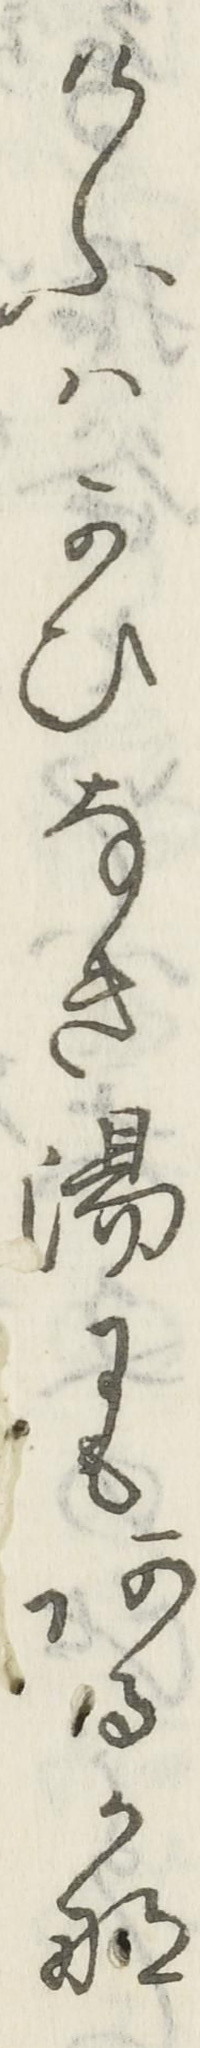けふはかひなき湯にもあるかな
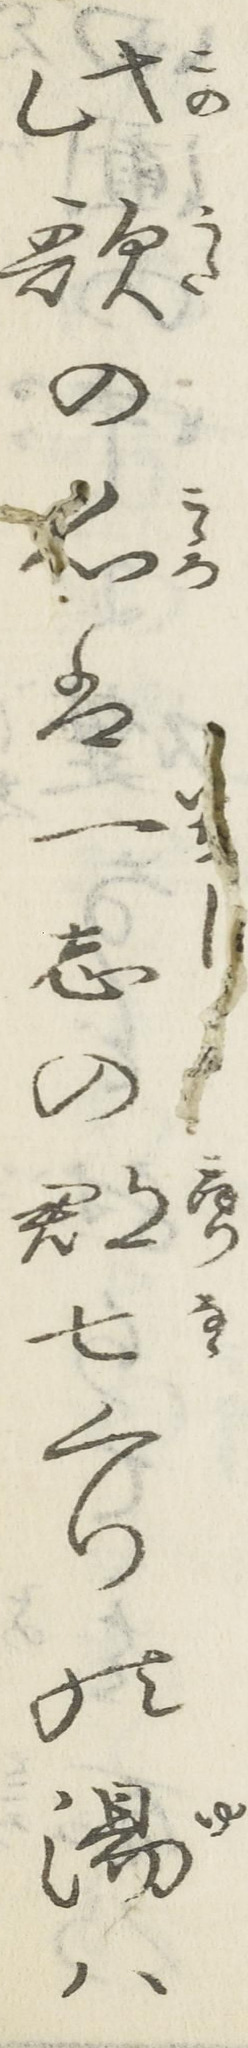此歌の心は一志の郡七くりの湯は
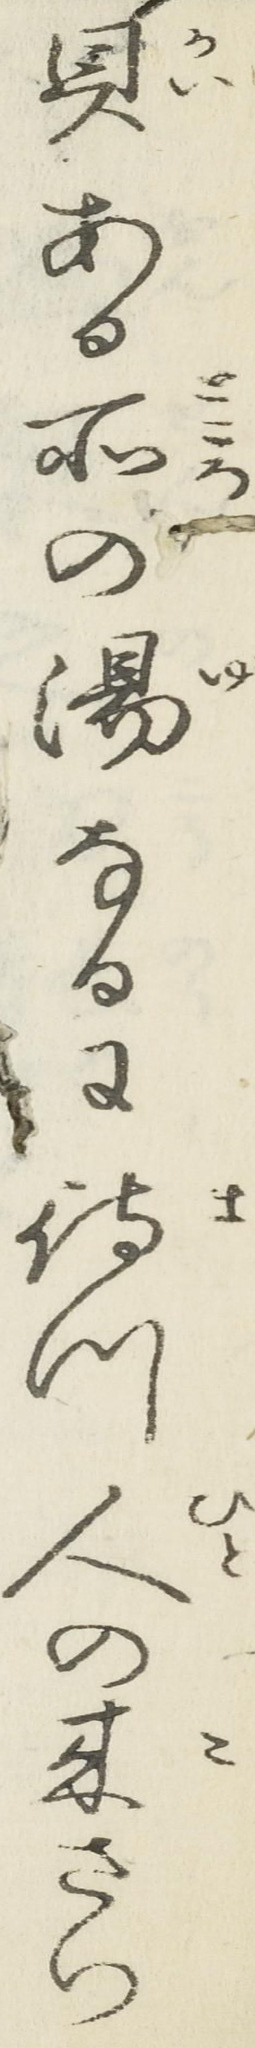貝ある所の湯なるに待つ人の来さり
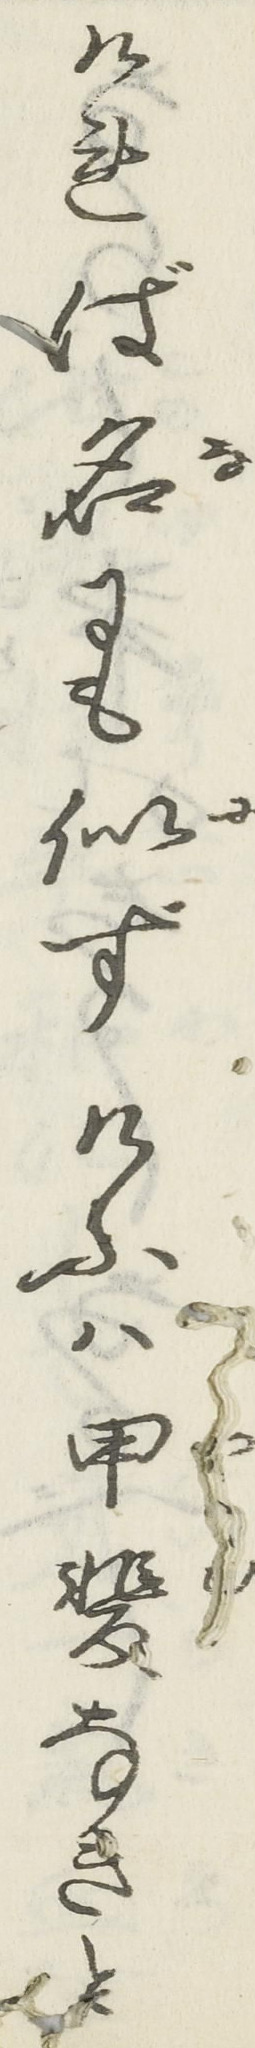ければ名にも似ずけふは甲斐なきと
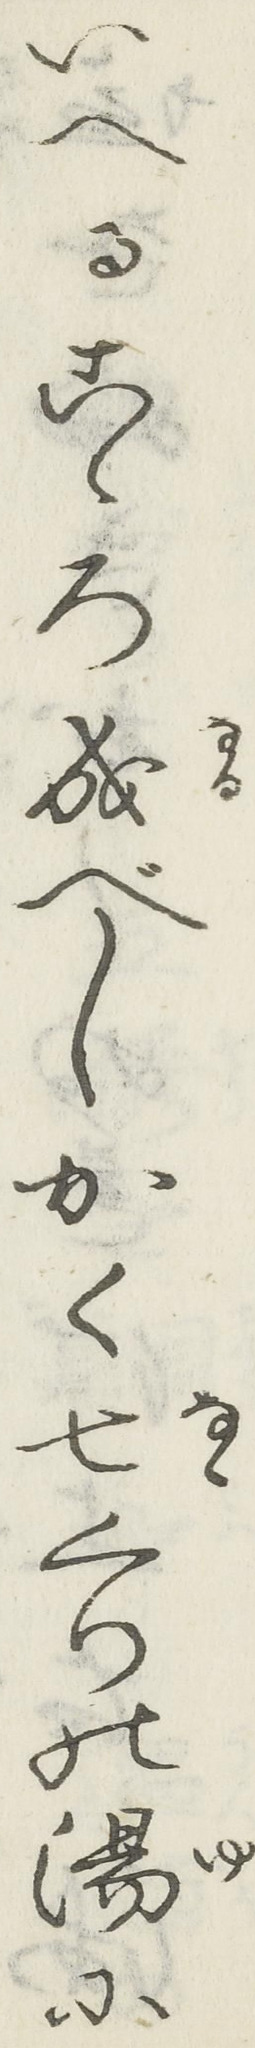いへるこゝろ成べしかく七くりの湯に
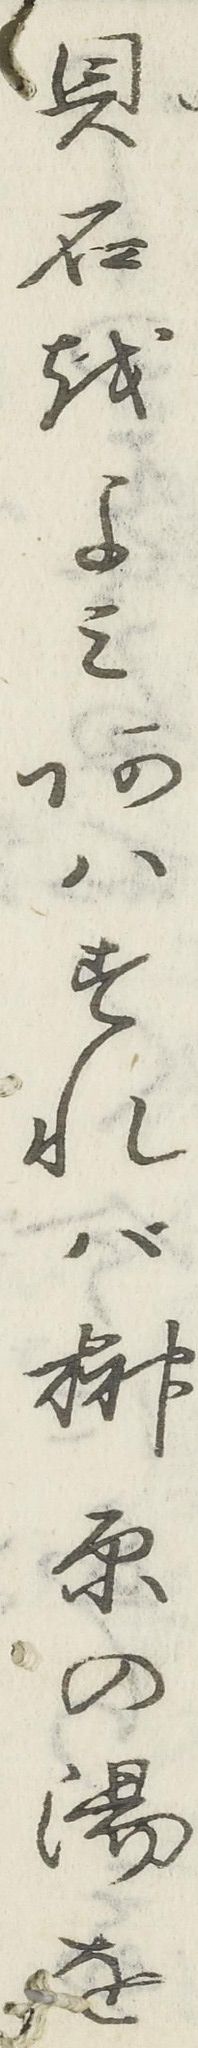貝石をのみあはすれば榊原の湯を
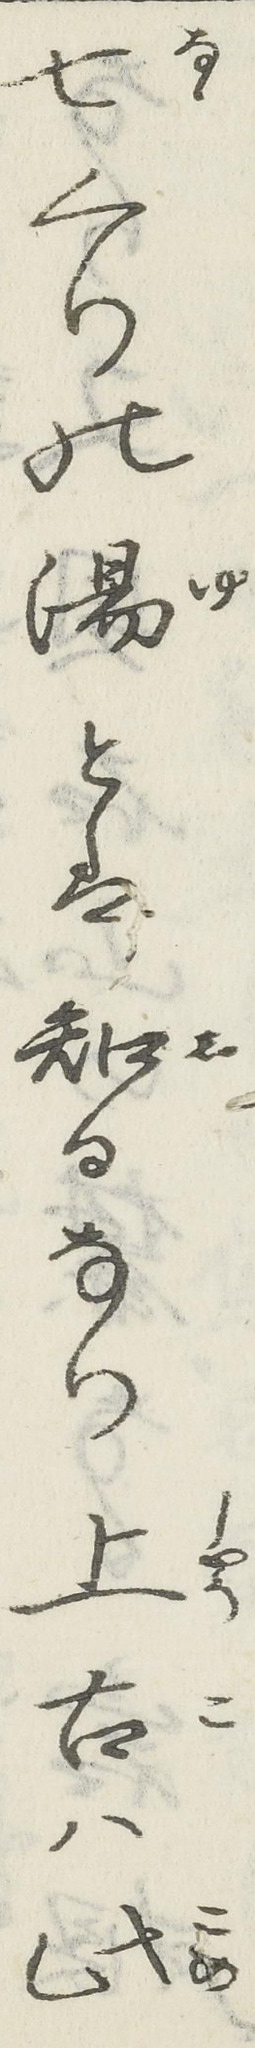七くりの湯とは知るなり上古は此
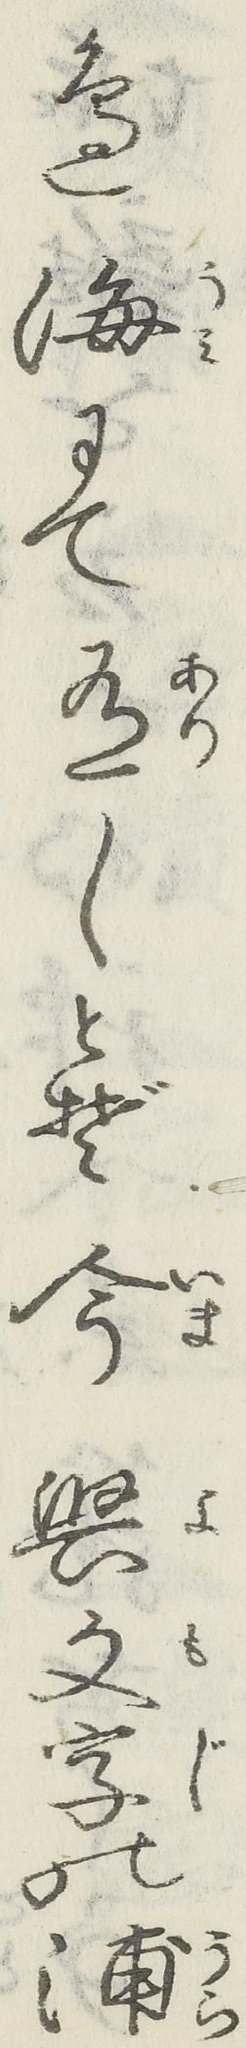辺海にて有しとぞ今與文字の浦
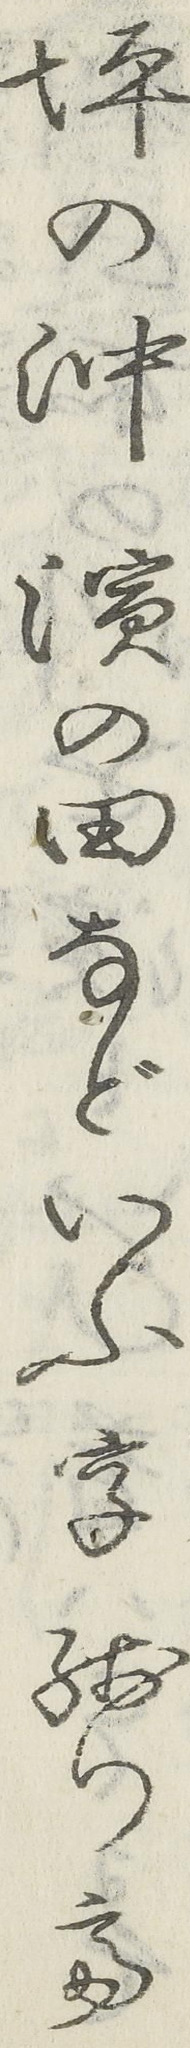坪の沖濱の田などいふ字残りて

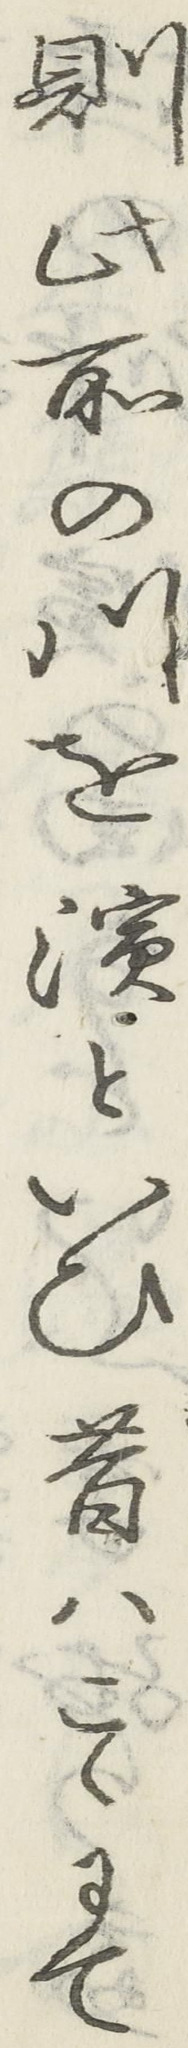則此所の川を濱といひ昔はここにて
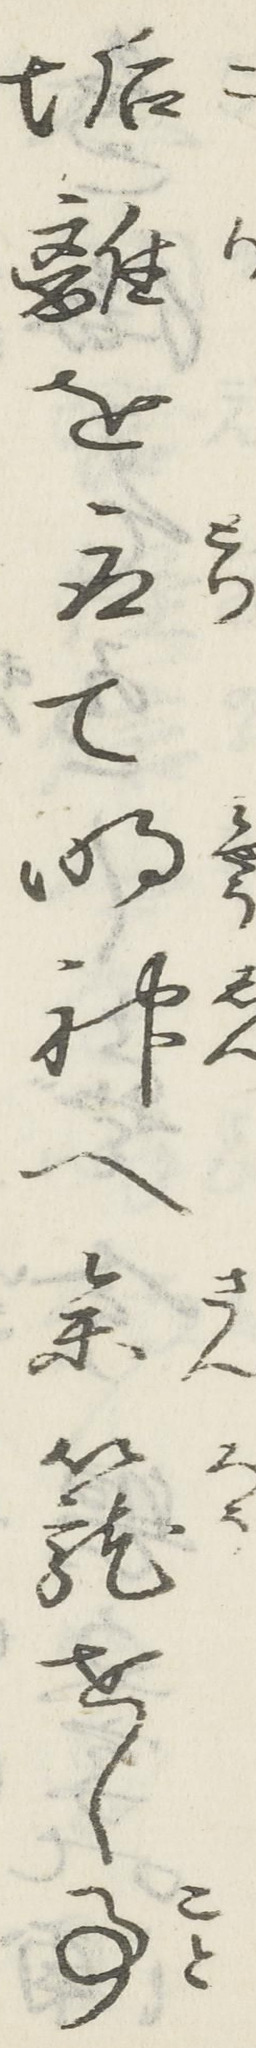垢離を取て明神へ参篭せし事
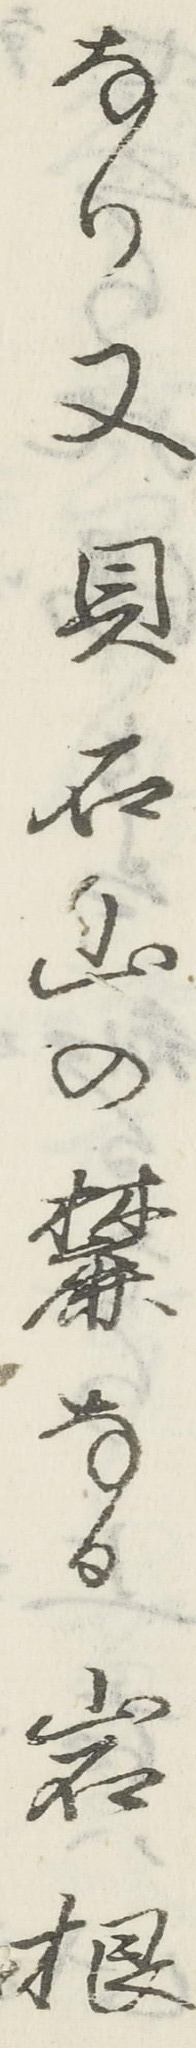なり又貝石山の麓なる岩根
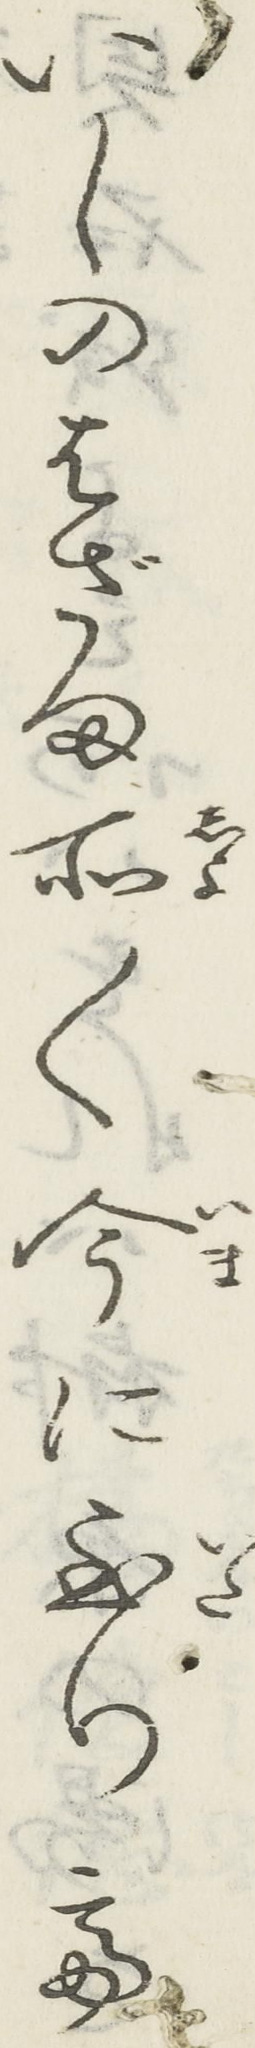いしのはざま所〱今に至りて
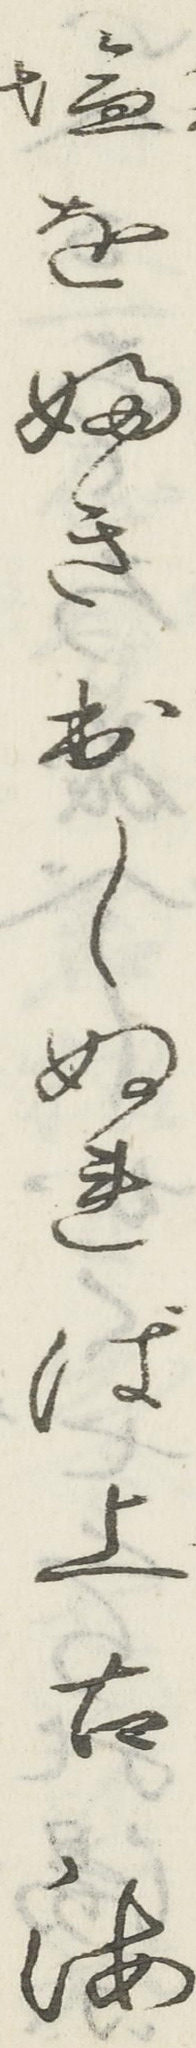塩をふき出しぬれば上古海
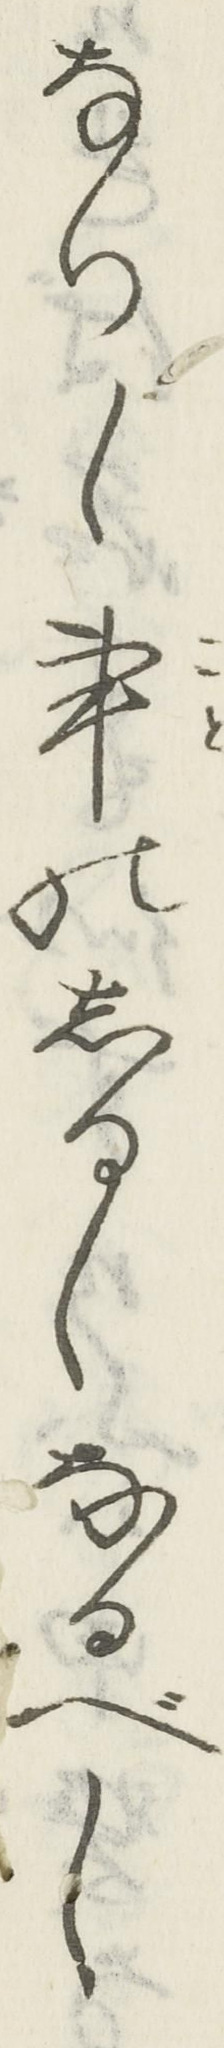なりし事のしるしなるべし
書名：温泉来由記
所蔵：東京大学地震研究所図書室 Earthquake Research Institute Library, The University of Tokyo, JAPAN
